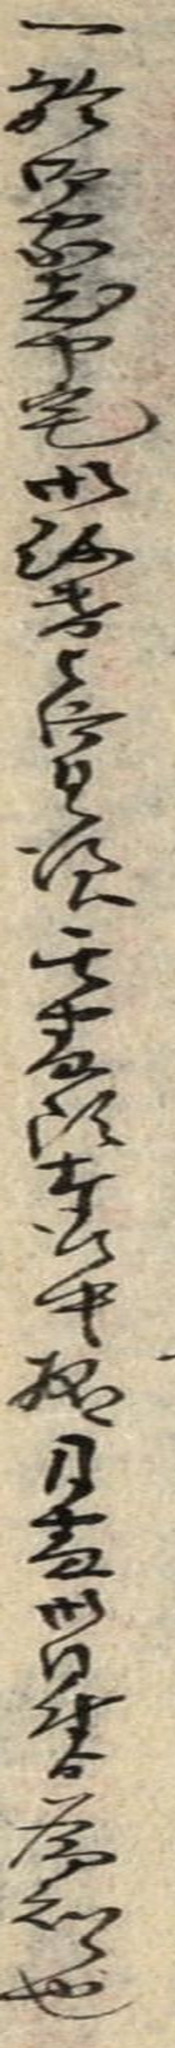一於御家老中宅御役替被仰付候得は其番頭奉行中抔へ月番御目付ゟ為知候也
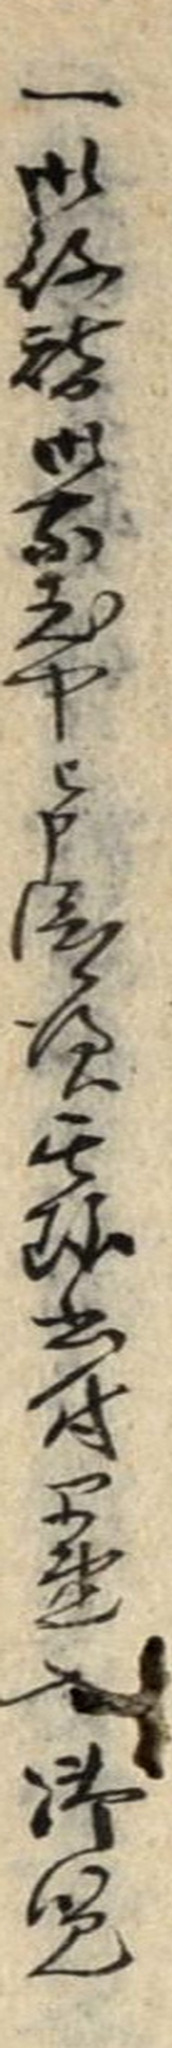一御役替御家老中被申渡候得は其趣書付早速入御覧
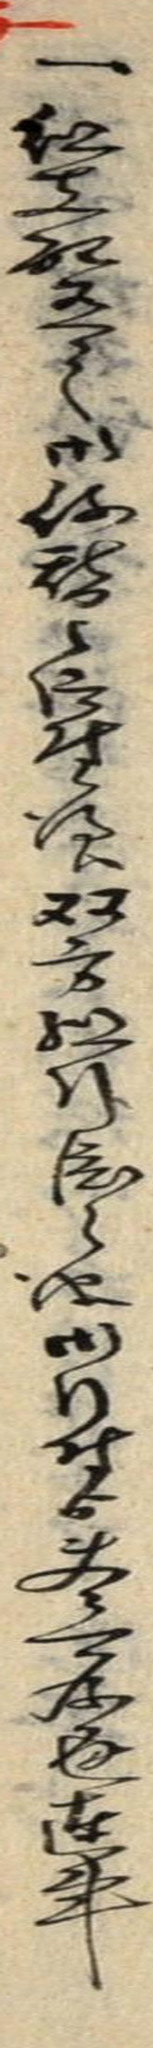一組支配有之御役替被仰付候得は双方組引渡之儀御目付ゟ夫々可及通達候事

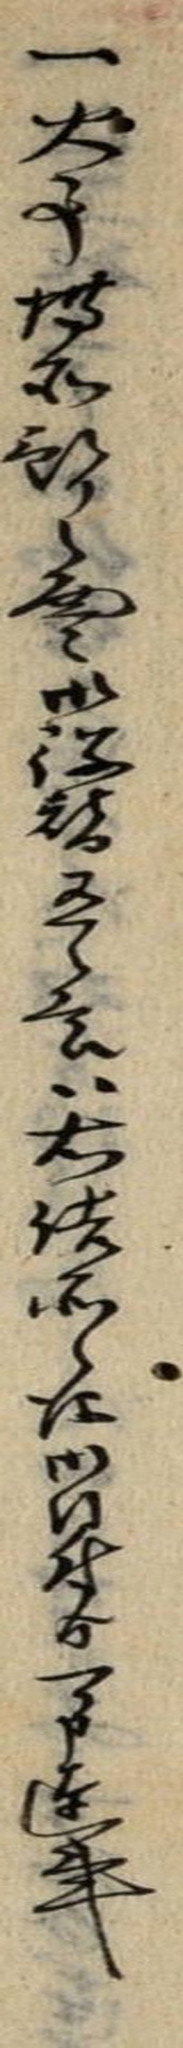一火事場所預り之面々御役替有之節は右詰所之儀御目付ゟ可申達事
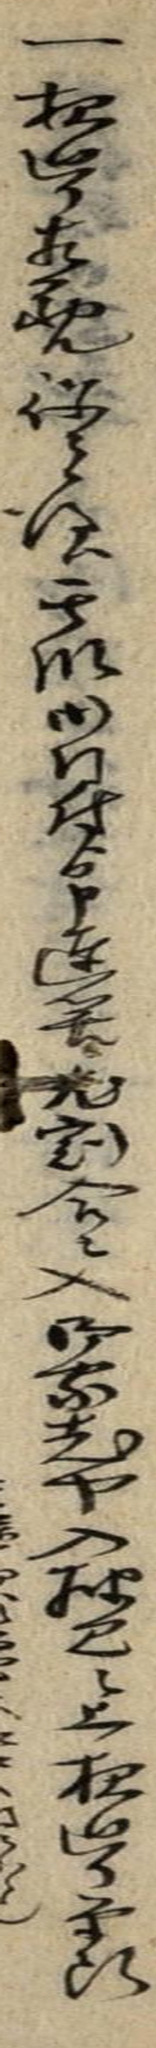一夜廻り相勤ル役に候得は其段御目付ゟ申達筈尤割合に入御家老中入披見候上夜廻り筆頭
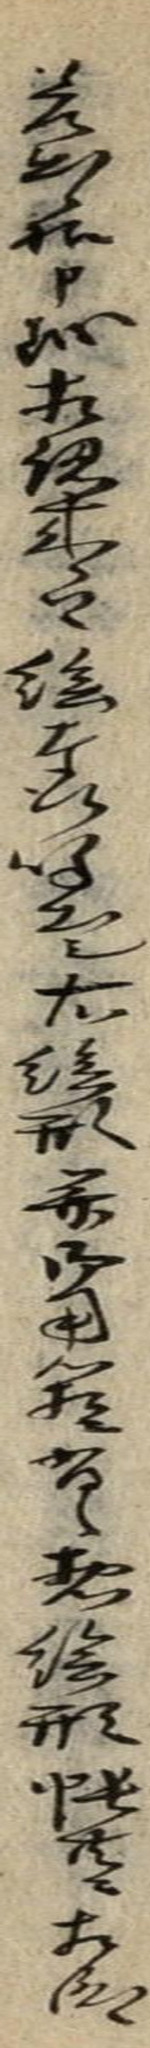差出候様申越相認来候はゝ絵奉行呼出し右絵形并御用箱に有之惣絵形帳共に相渡候
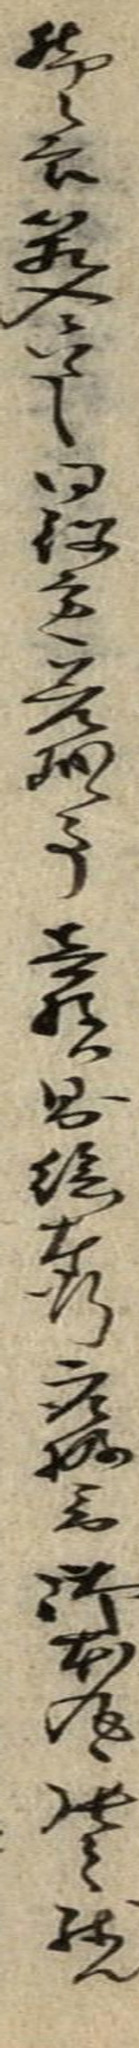脚之節箱入にいたし同役方へ差越候事壱枚は則絵奉行取扱に而御本丸へ張之残ル
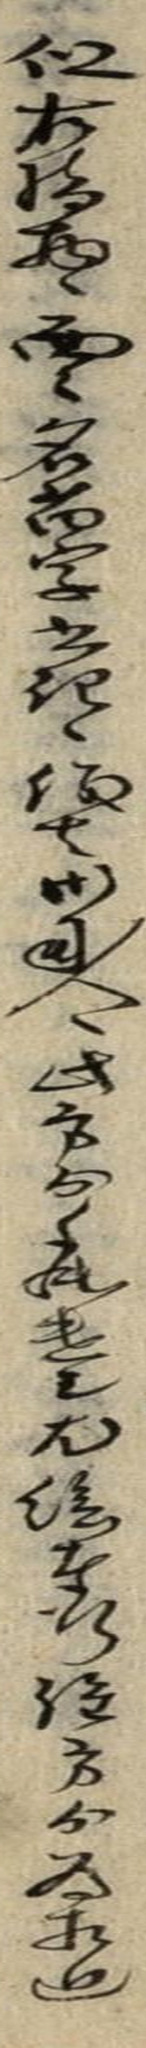但右指物へ面々名苗字書記候儀は御用人へ此方ゟ手紙遣し尤絵奉行誰方ゟ為相廻
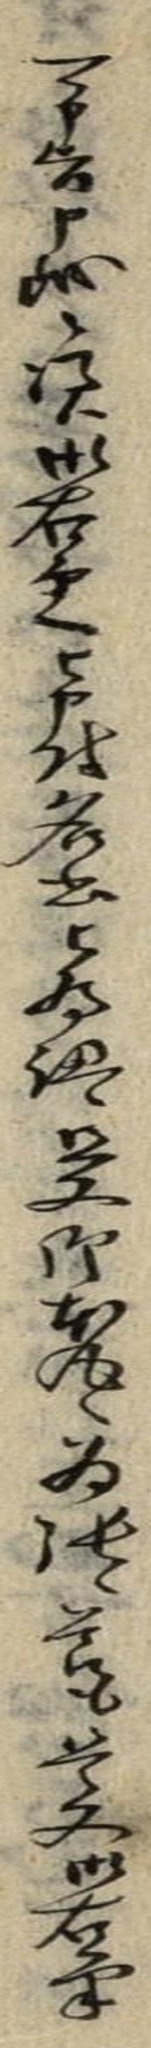可申旨申越候得は御右筆へ被申付名書被為認候且又御本丸へ為張候節も是又御右筆
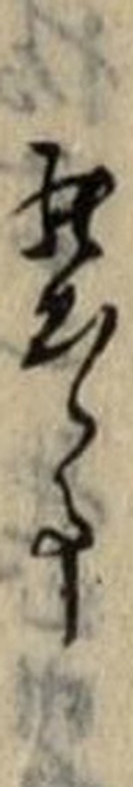罷出候事
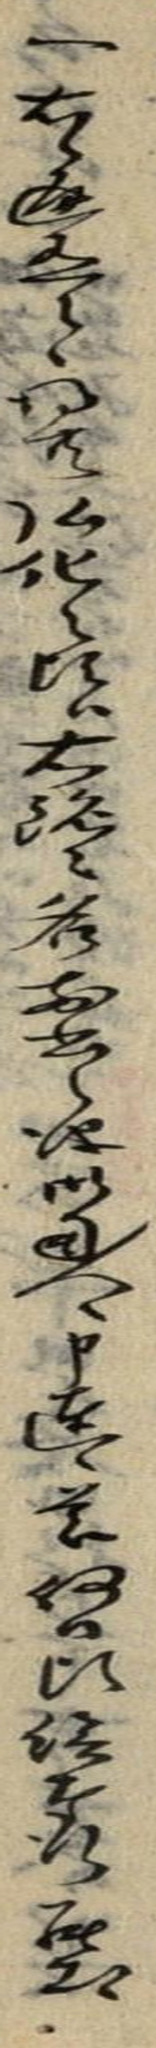一右之通有之候得共弘化之頃は右銘々名前書候儀御用人へ申達候節何日頃絵奉行罷出候
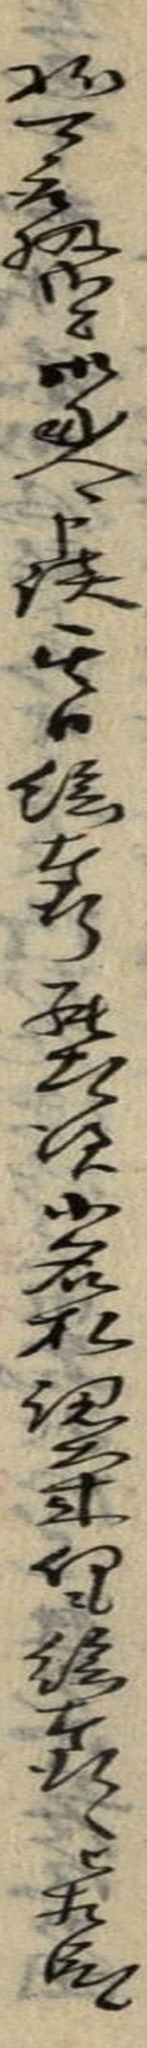様可取扱哉と御用人へ申談其日絵奉行罷出候得は小名札認出来何も絵奉行へ被相渡候
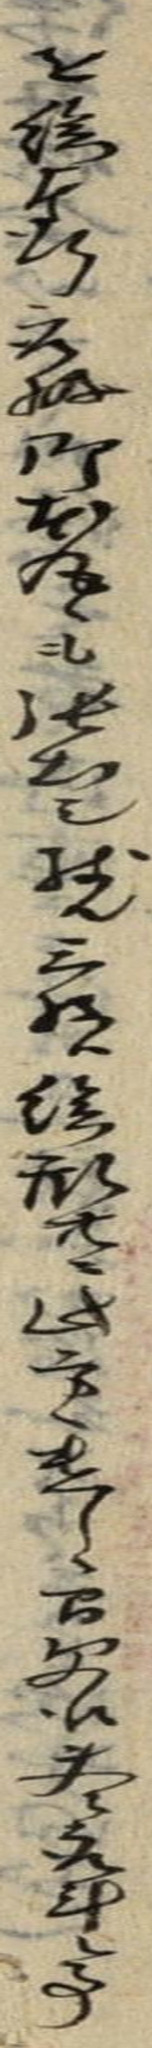を絵奉行取扱御本丸へも張出し残ル三枚は絵形共に此方へ遣之候間受取夫々取斗候事
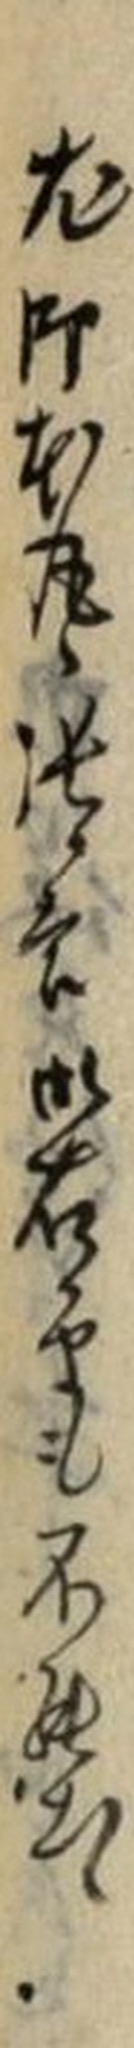尤御本丸へ張候節御右筆も不罷出候
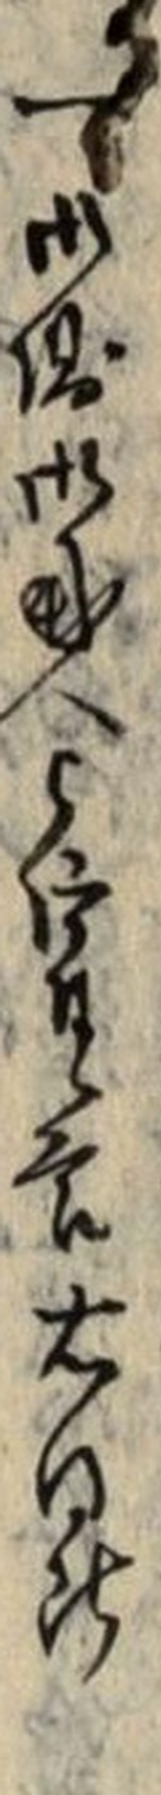一御側御用人被仰付候節右同断
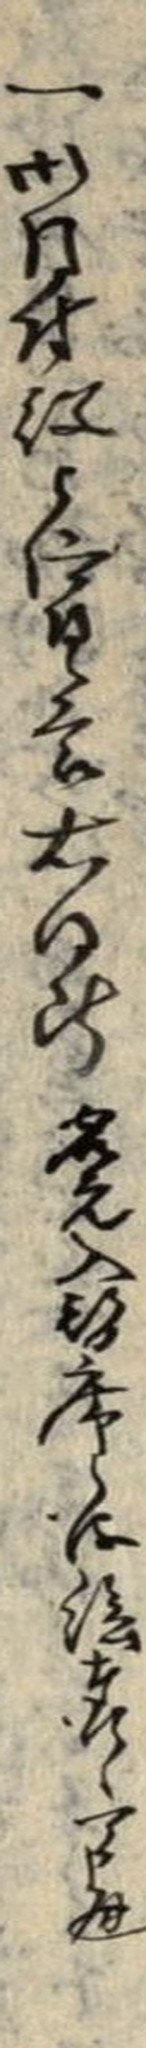一御目付役被仰付候節右同断名元入替席之儀絵奉行へ可申通
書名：御用并被仰出之部
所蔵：福井県文書館 Fukui Prefectural Archives
